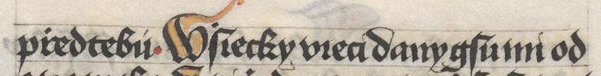pṙedtebú.Wẛiecky vieci dany gſu mi od
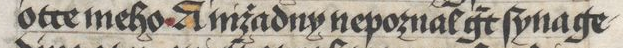otce meho.A niżadny nepoznal ḡt ſyna ge¬
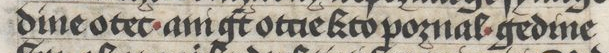dine otec.ani ḡt otcie kto poznal.gedine
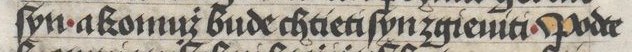ſyn.akomuż bude chtieti ſyn zgieuiti.Podte
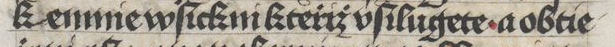kemnie wẛickni kteṙiż vſilugete.a obtie¬
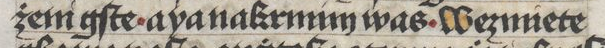żeni gſte.a ya nakrmím was.Wezmiete
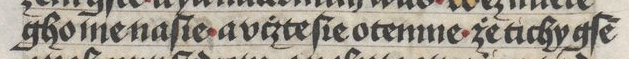gho me naſie.a vcżte ſie otemne.że tichy gſē
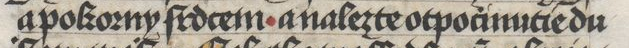a pokorny ſrdcem.a nalezte otpoċinutíe du¬
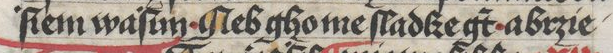ẛiem waẛim.Neb gho me ſladke ḡt.a brzie
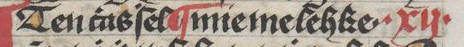Ten ċas ẛel. mie me lehke.xij.
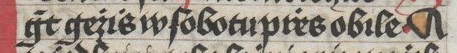ḡt geżiṡ w ſobotu pṙes obile A
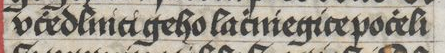vċedlníci geho laċniegíce poċeli
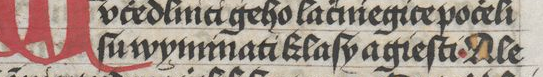ſu wymínati klaſy a gíeſti.Ale
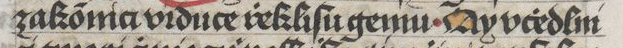zakōnici viduce ṙekli ſu gemu.Ay vċedlní¬
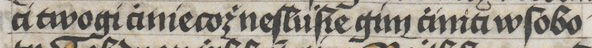ci twogi ċiníe coż neſluẛíe gim ċiniti w ſobo¬
